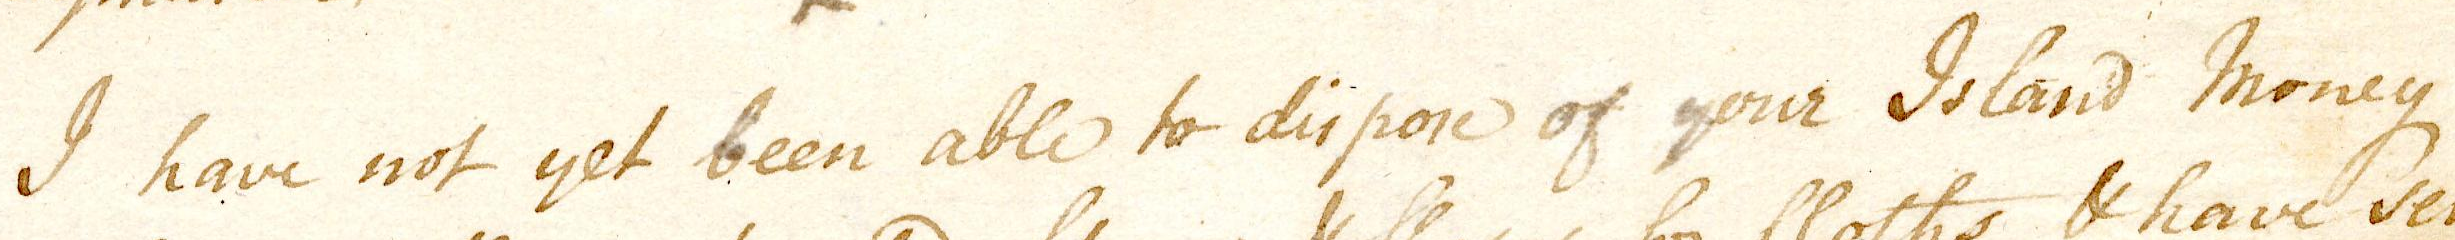I have not yet been able to dispose of your Island money
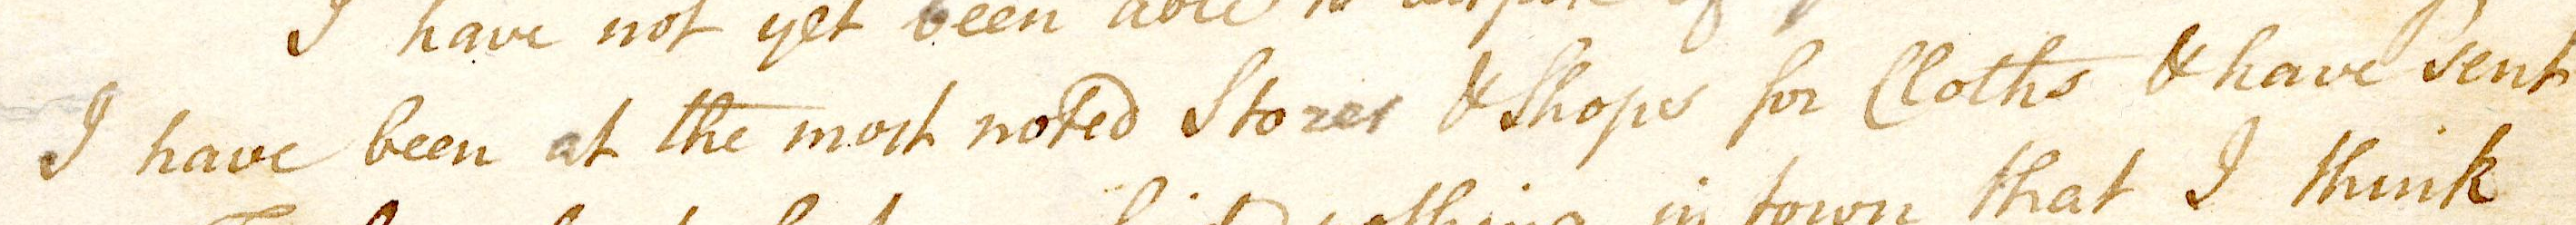I have been at the mort noted Stozer & Shops for Cloths & have sent
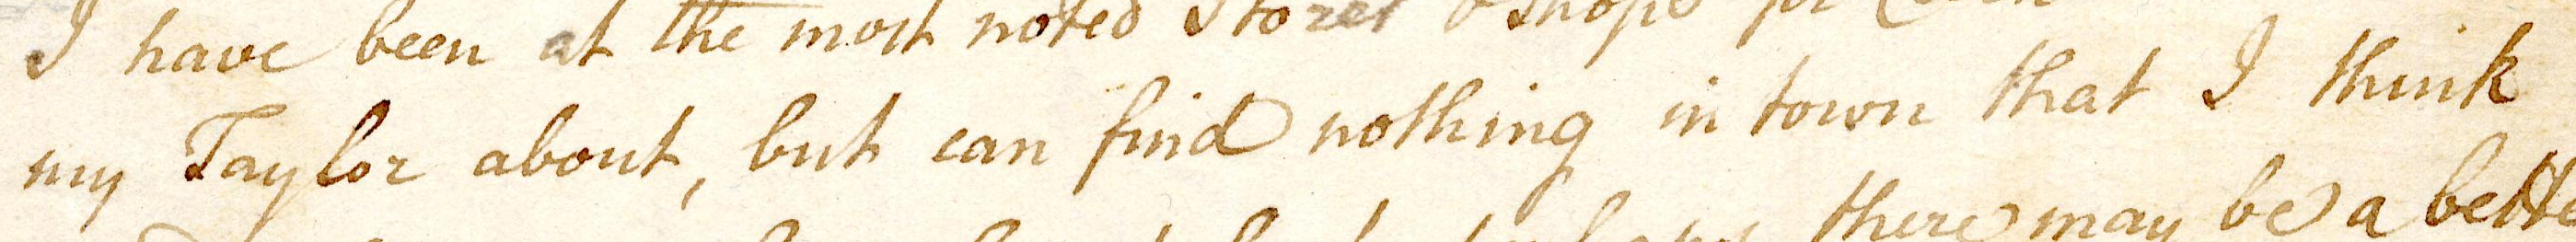my Taylor about but can find nothing in town that I think
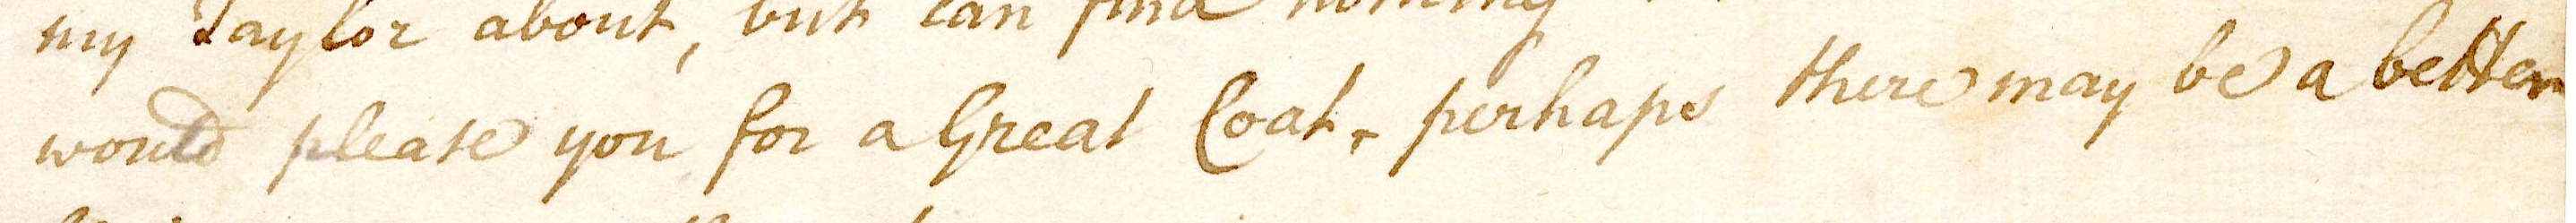would please you for a Great Coat, perhaps there may be a better
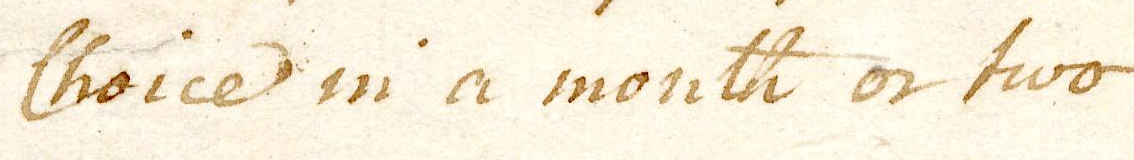Choice in a month or two
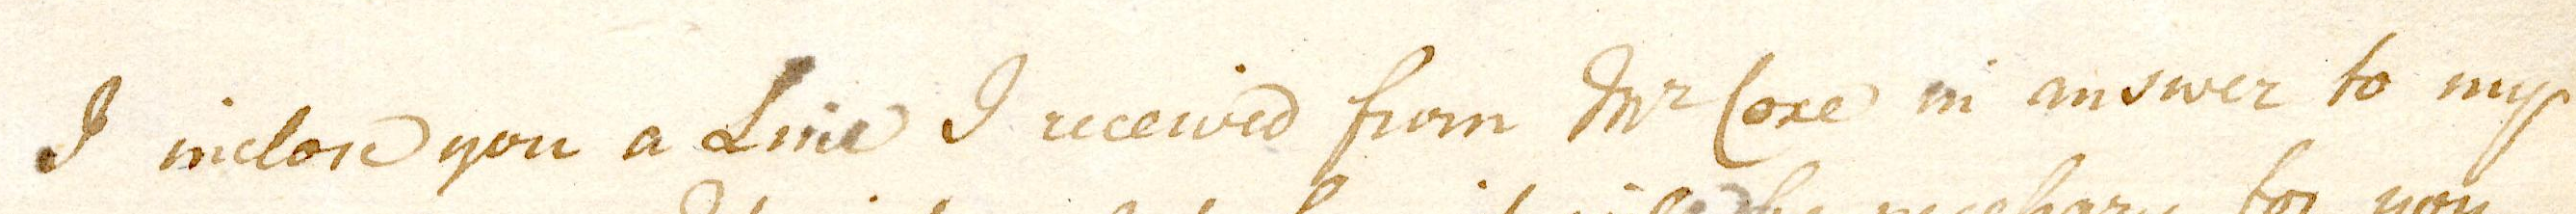I inclose you a Line I received from M^r Coxe in answer to my
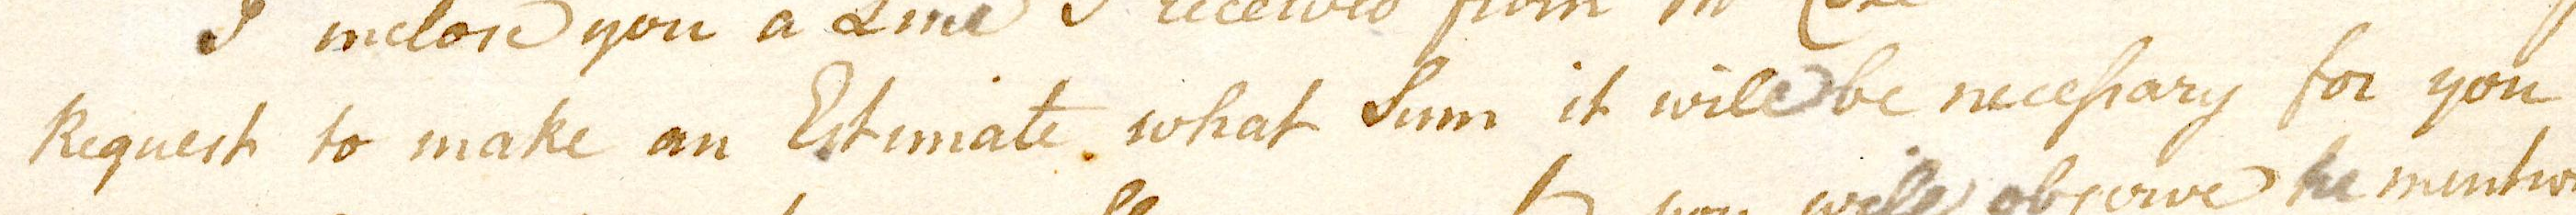Request to make an Estimate what Sum it will be necessary for you
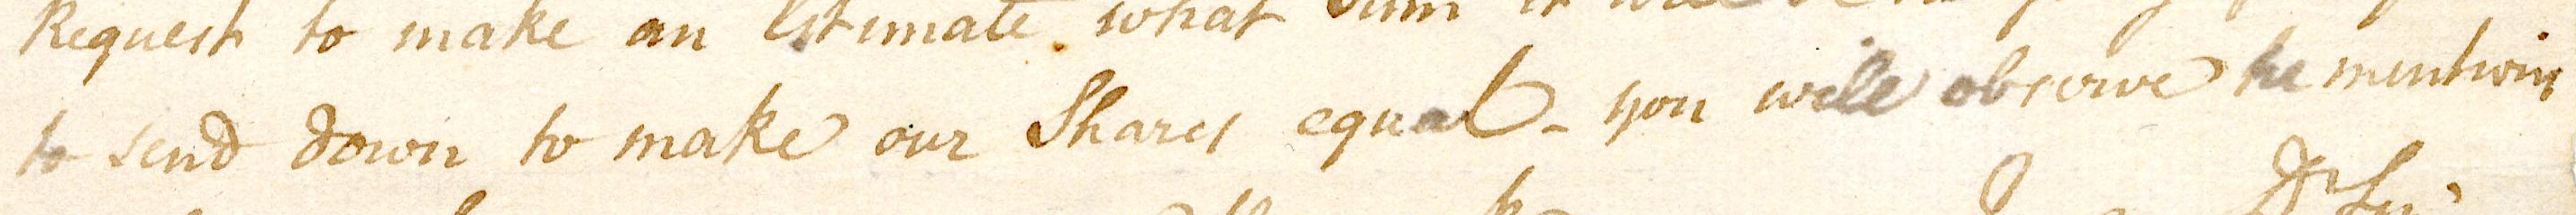to send down to make our Shares equal. you will observe he mentions
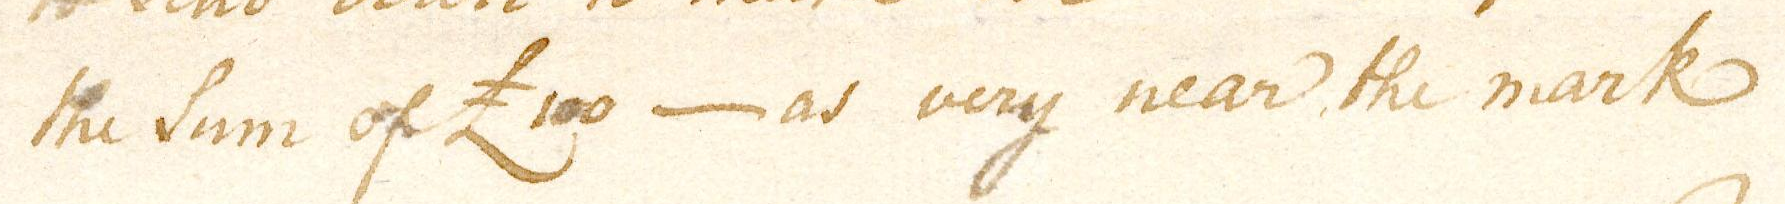the Sum of £100- as very near the mark
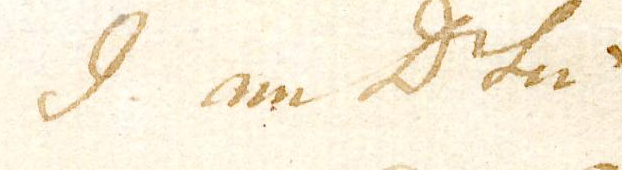I am D^r Sir
